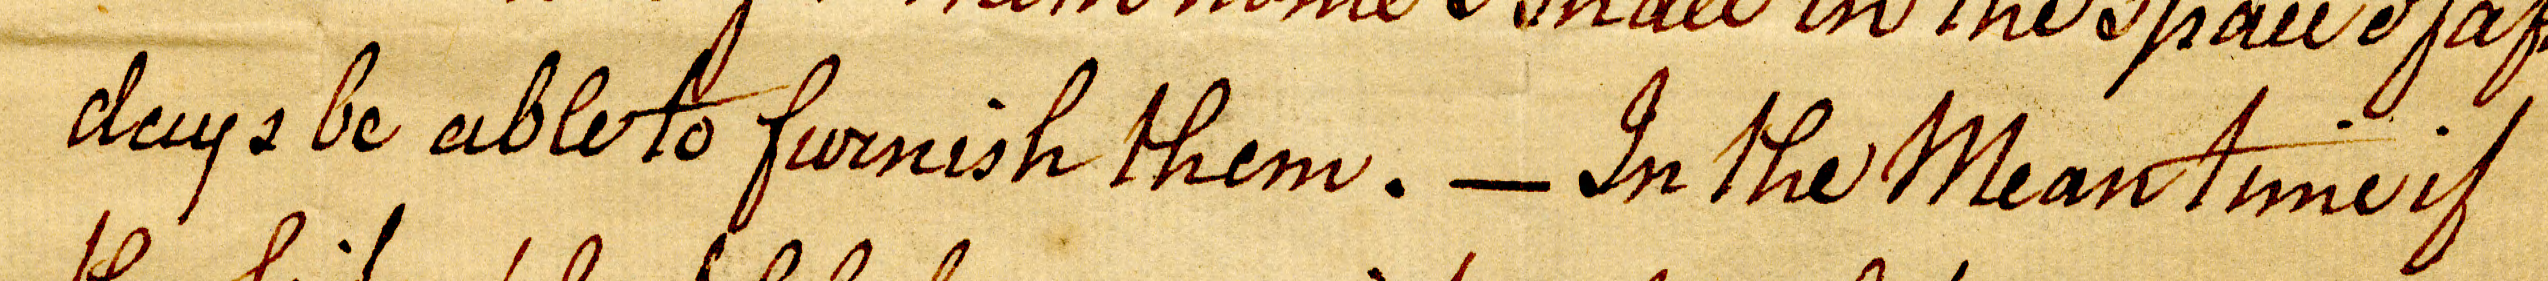days be able to furnish them.- In the Meantime if
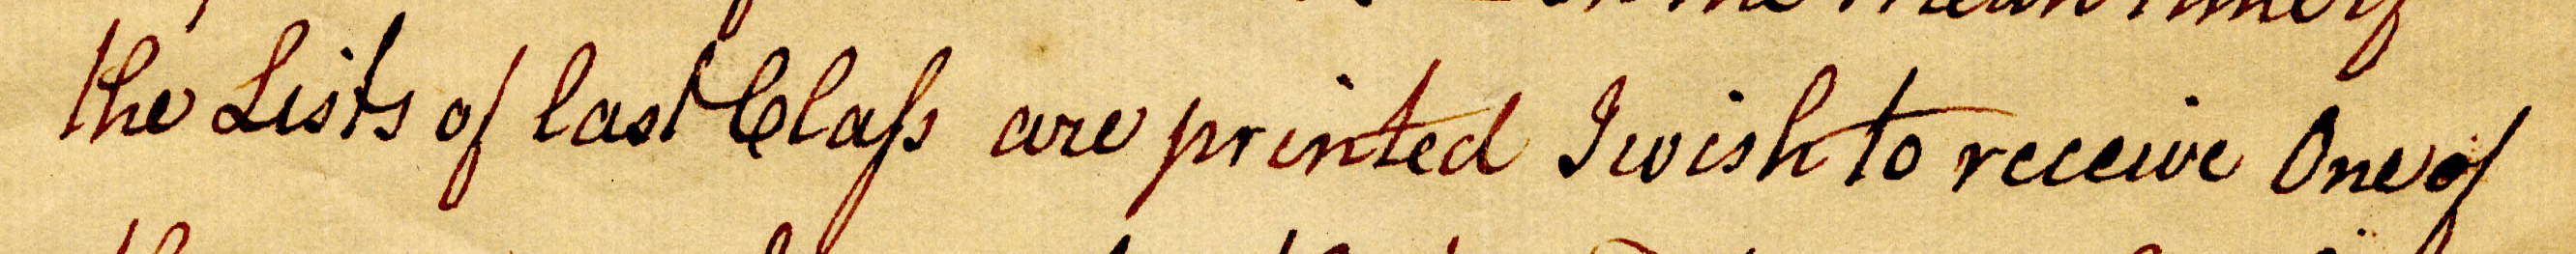the Lists of last Class are printed I wish to receive One of
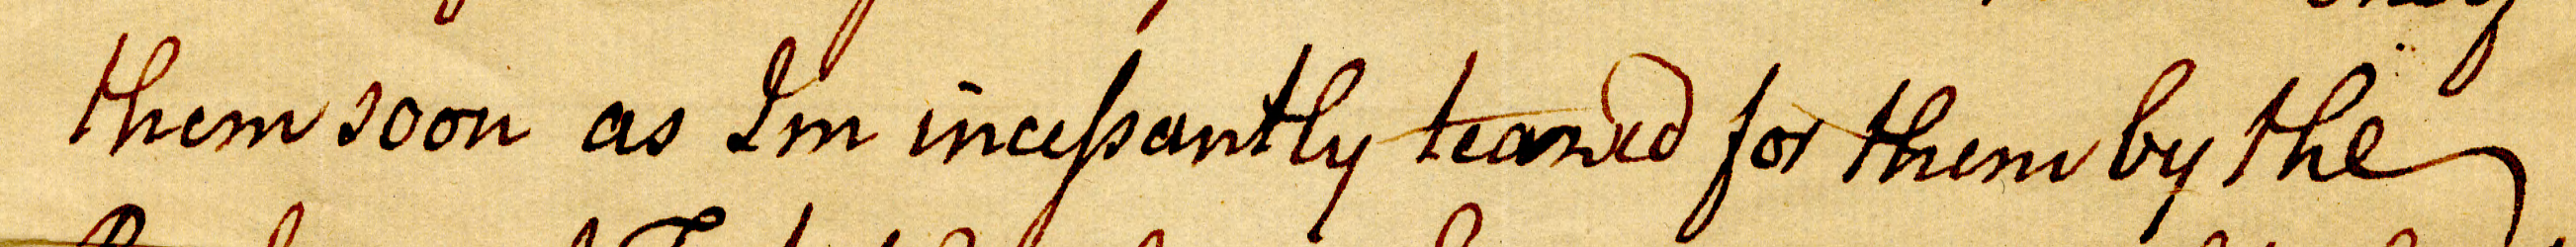them soon as Im incessantly Leaned for them by the
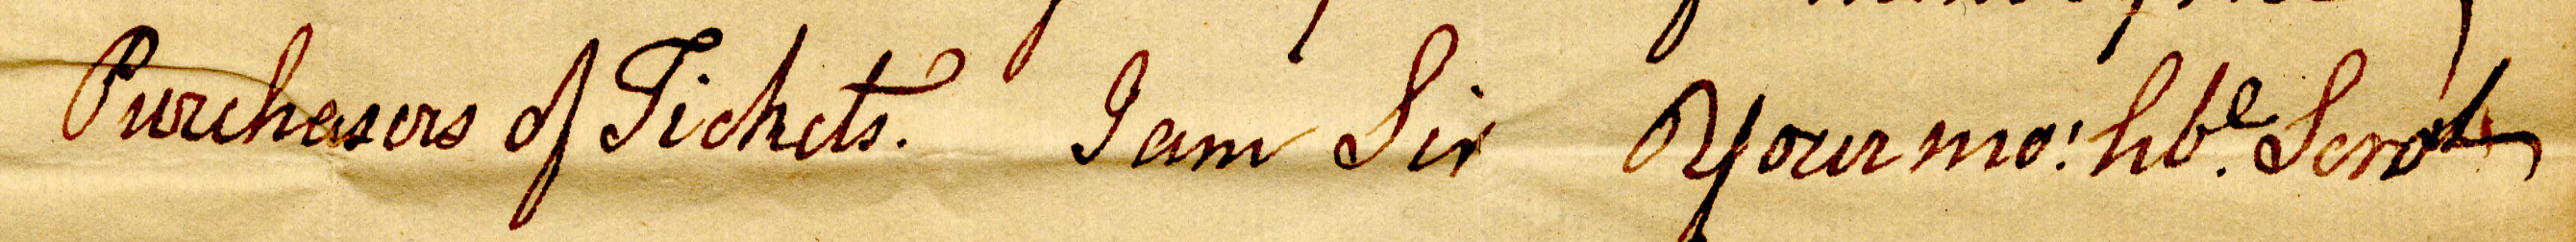Purchasers of Tickets. I am Sir Your mo: hb^l. Serv^t
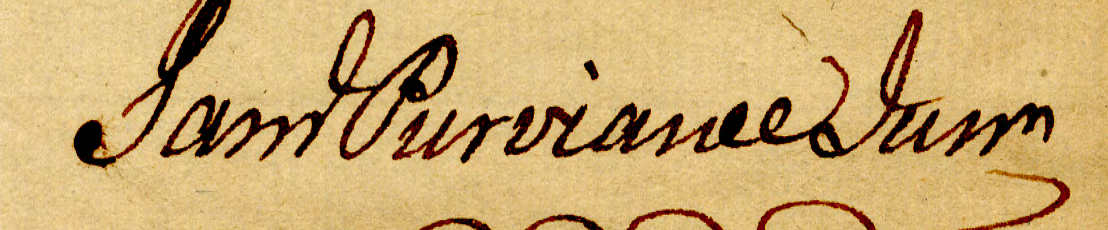Sam^l Purviance Junr
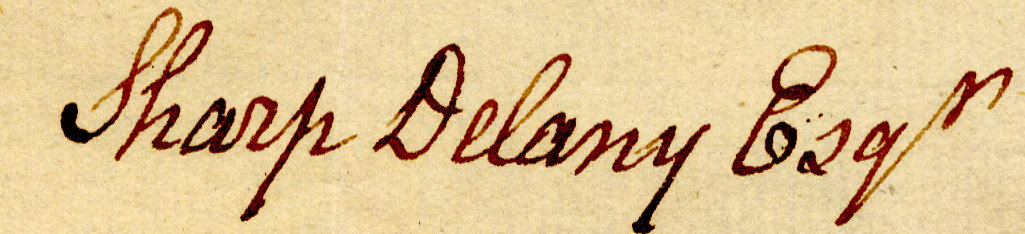Sharp Delany Esq^r
